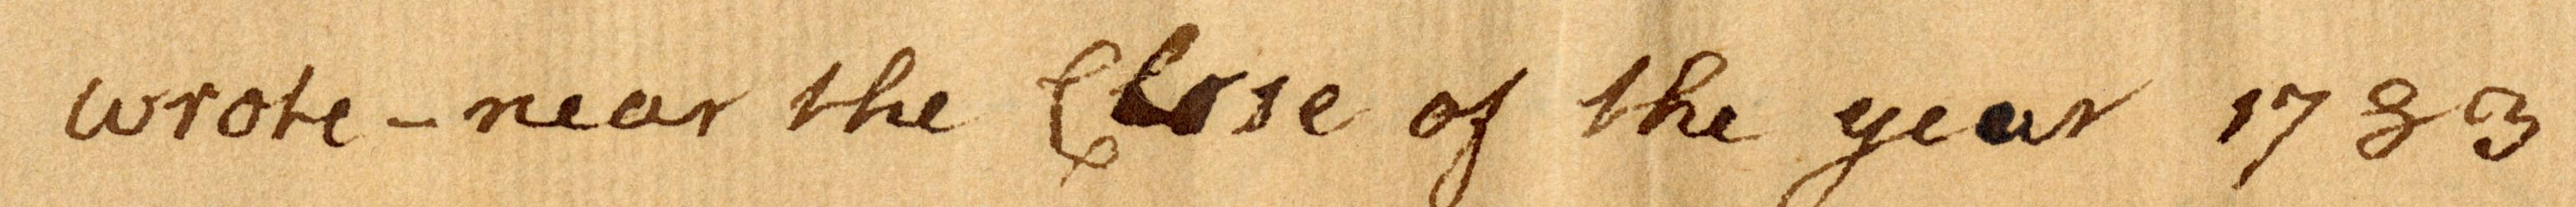Wrote- near the Close of the year 1783
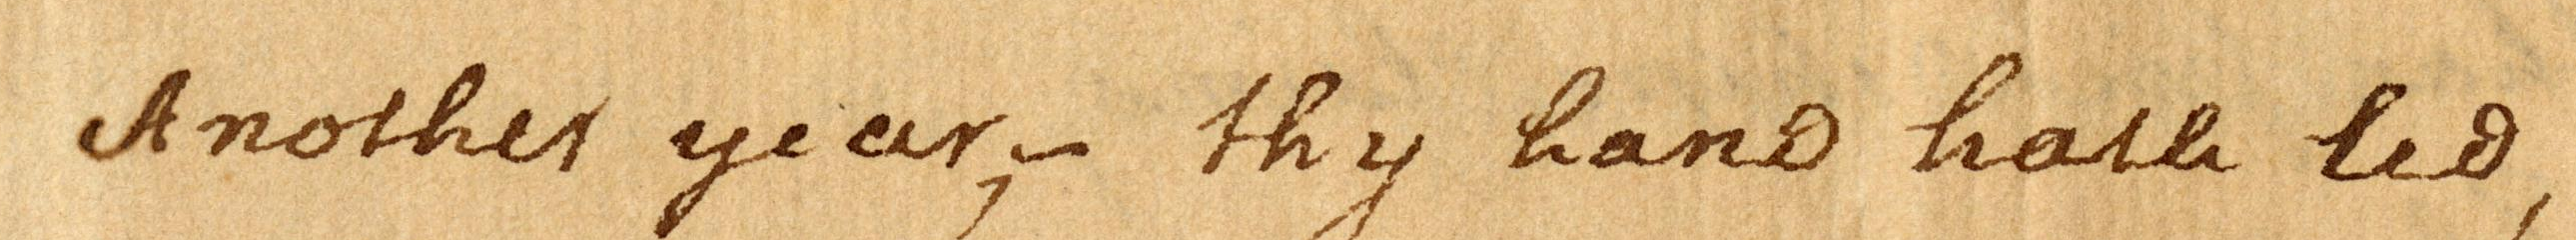Another year,- thy hand hath led,
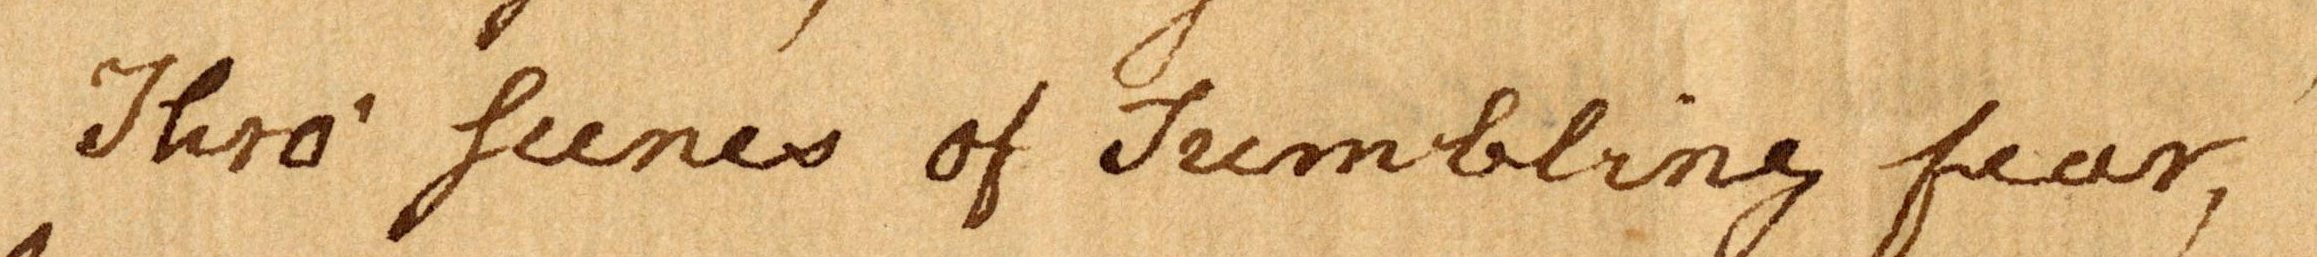Thro' scenes of trembling fear,
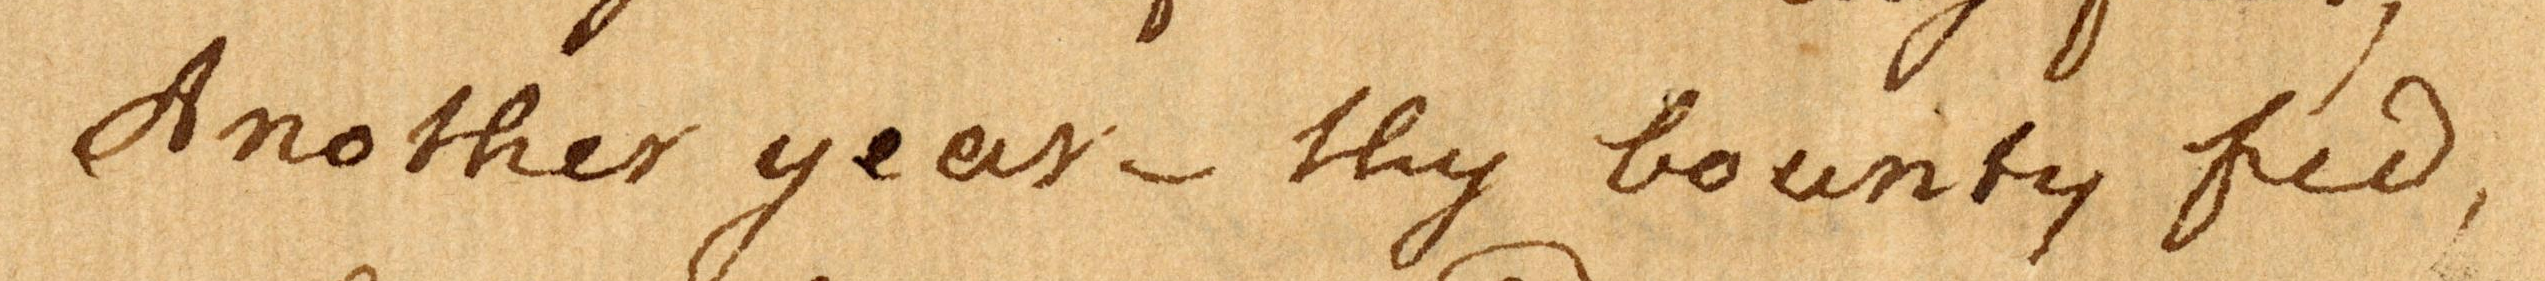Another year- thy bounty fed,
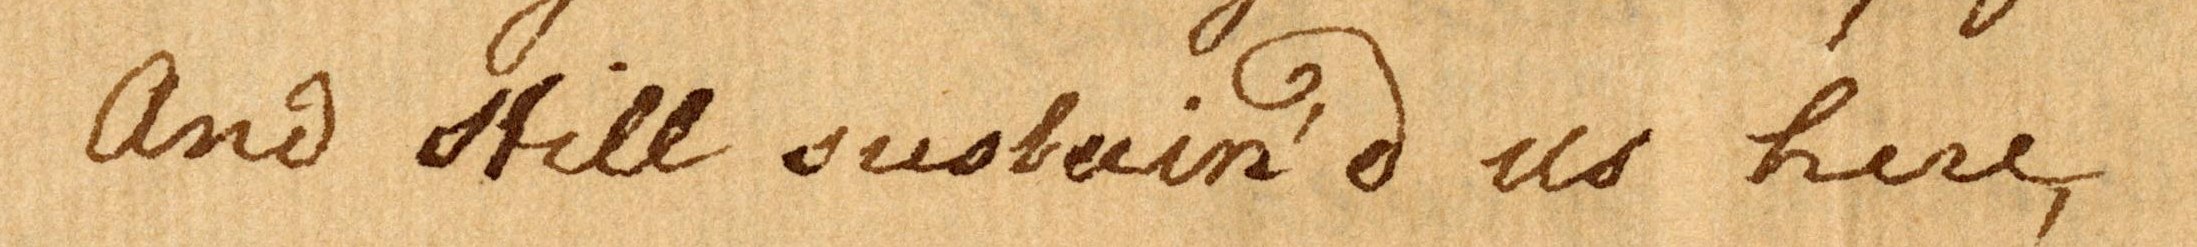And still sustain'd us here,
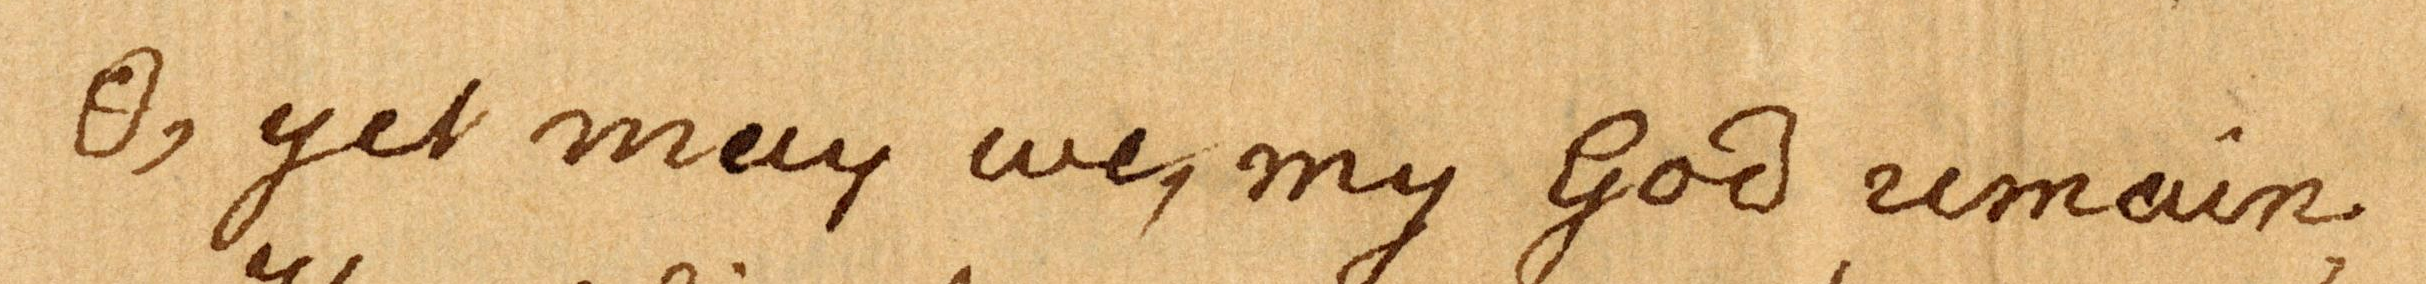O, yet may we, my God remain,
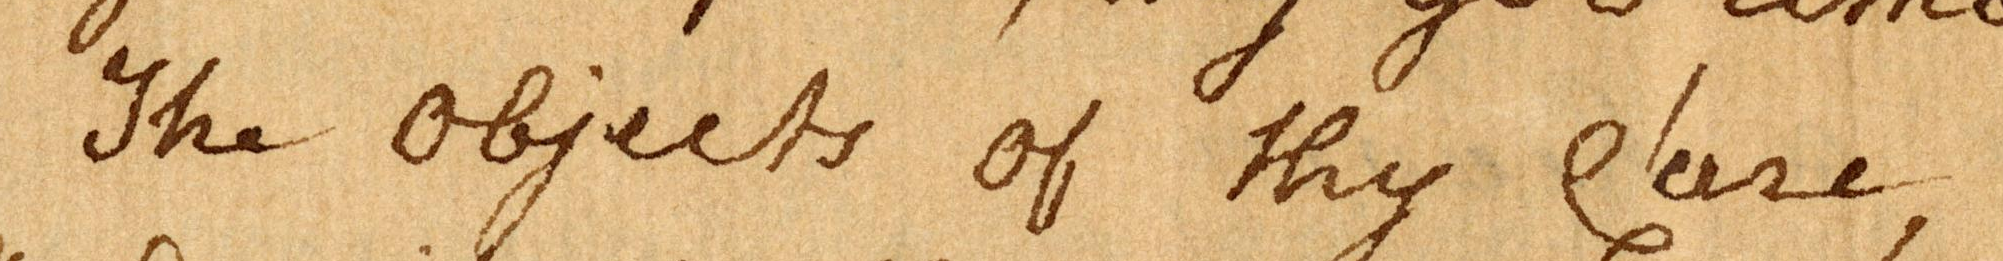The objects of the Care,
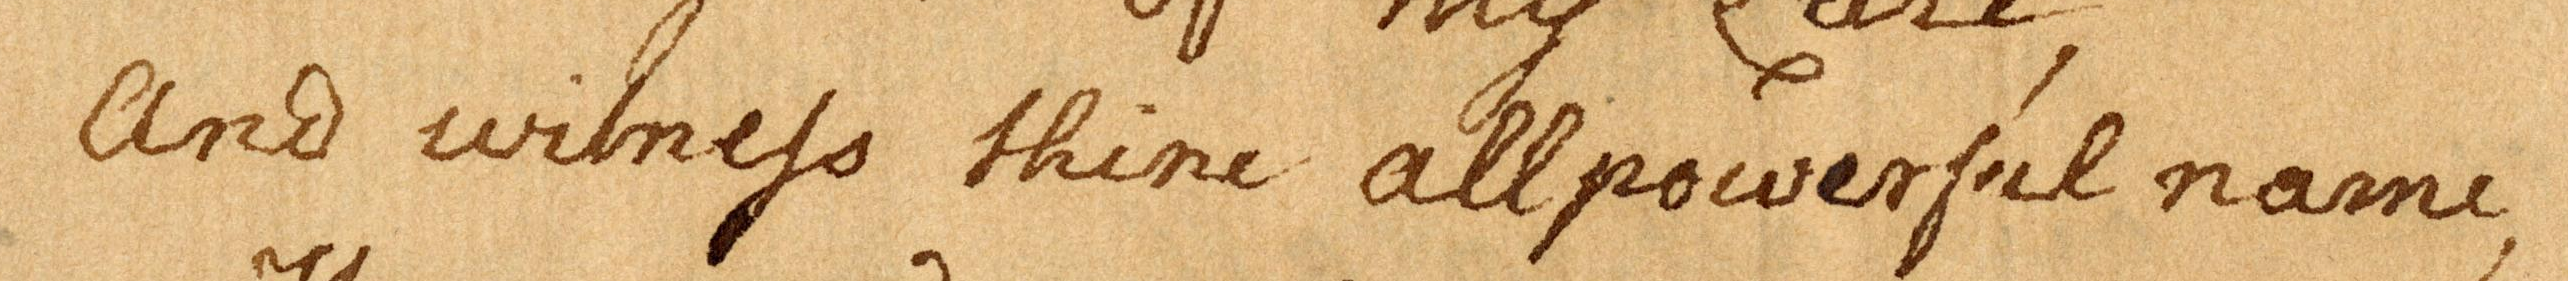And witness thine allpowerful name,
